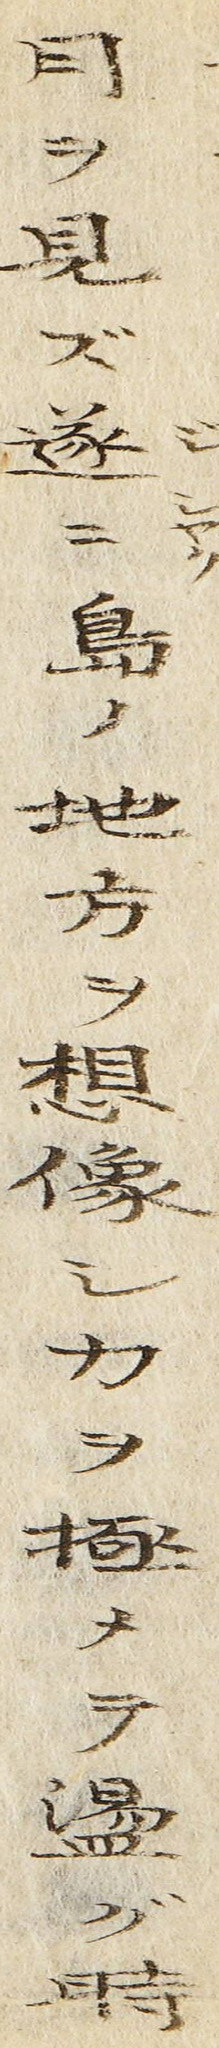月ヲ見ズ遂ニ島ノ地方ヲ想像シ力ヲ極メテ盪グ時
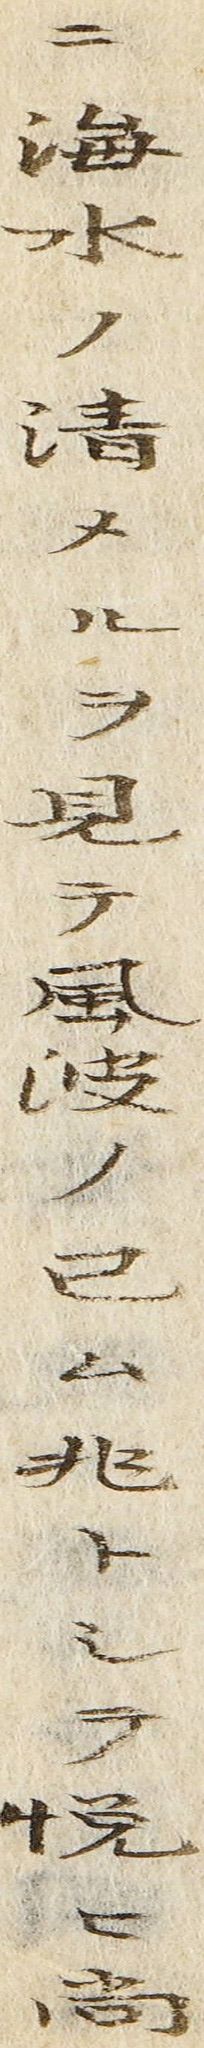ニ海水ノ清メルヲ見テ風波ノ已ム兆トシテ悦ヒ尚
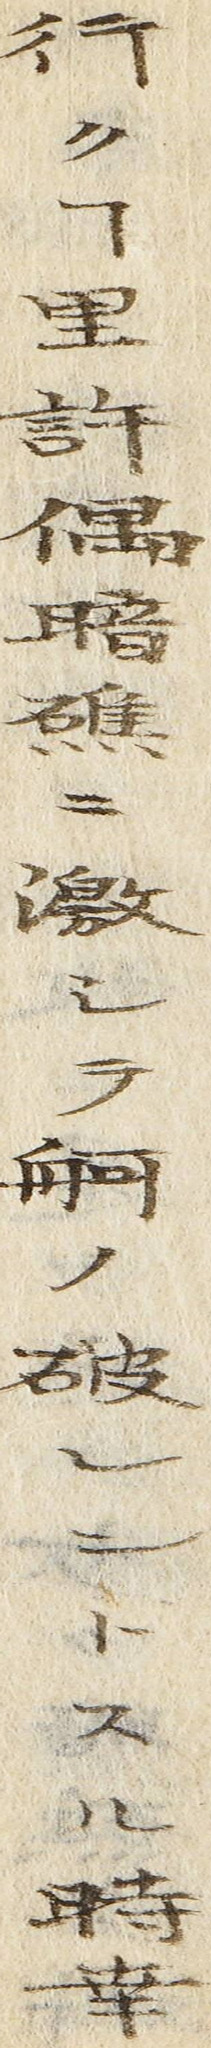行クコト里許偶暗礁ニ激シテ舸ノ破レントスル時幸
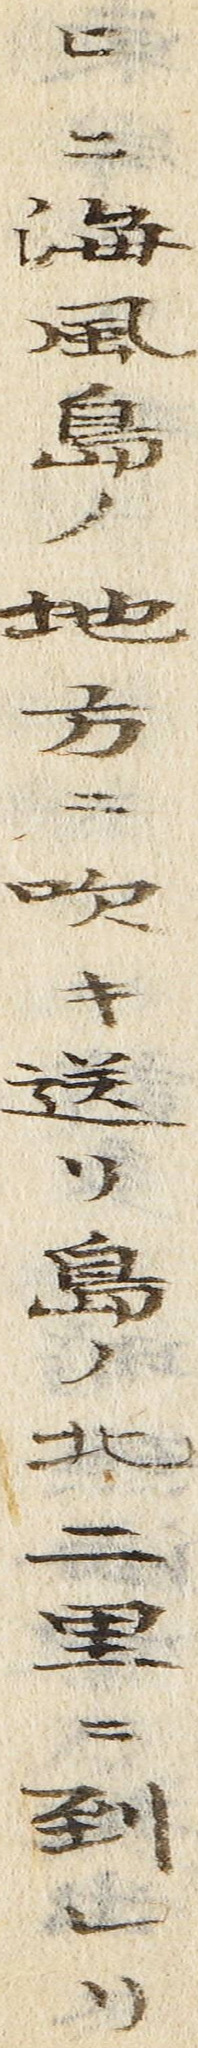ヒニ海風島ノ地方ニ吹キ送リ島ノ北二里ニ到レリ
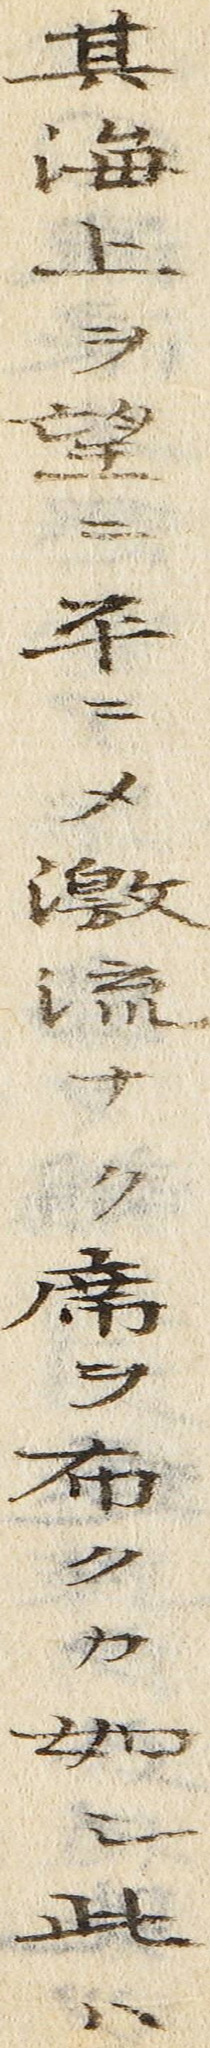其海上ヲ望ニ平ニシテ激流ナク席ヲ布クカ如シ此ハ
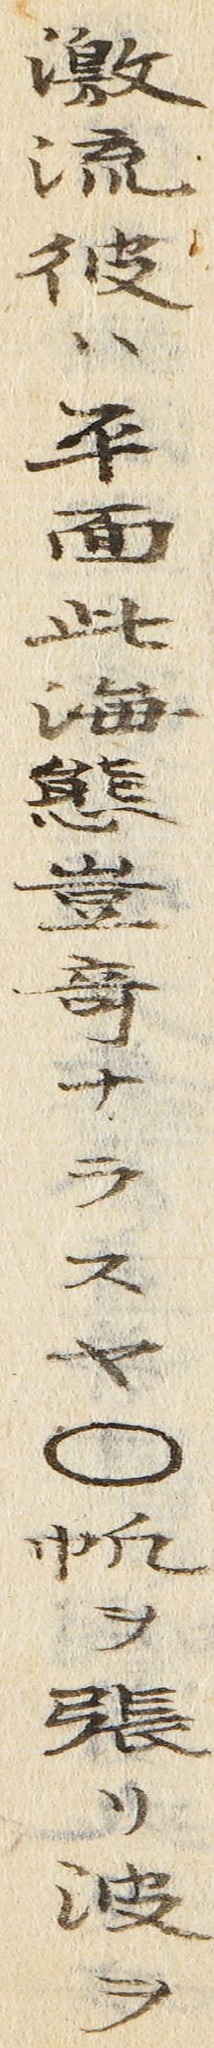激流彼ハ平面此海態豈奇ナラスヤ◯帆ヲ張リ波ヲ
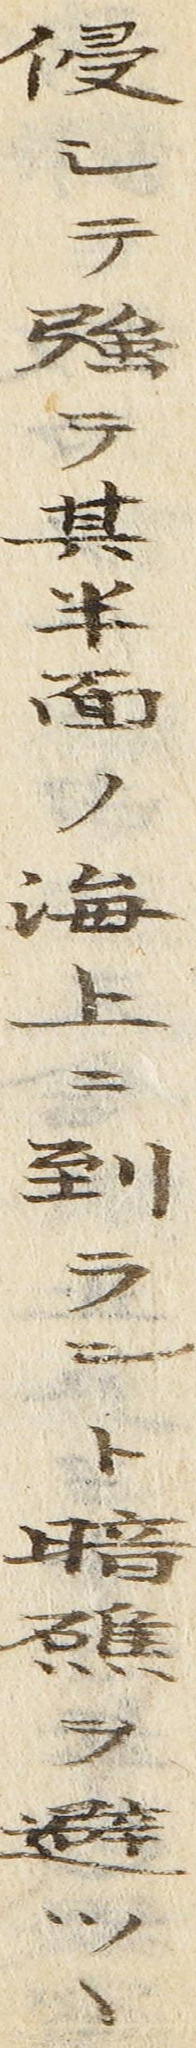侵シテ強テ其半面ノ海上ニ到ラント暗礁ヲ避ツヽ
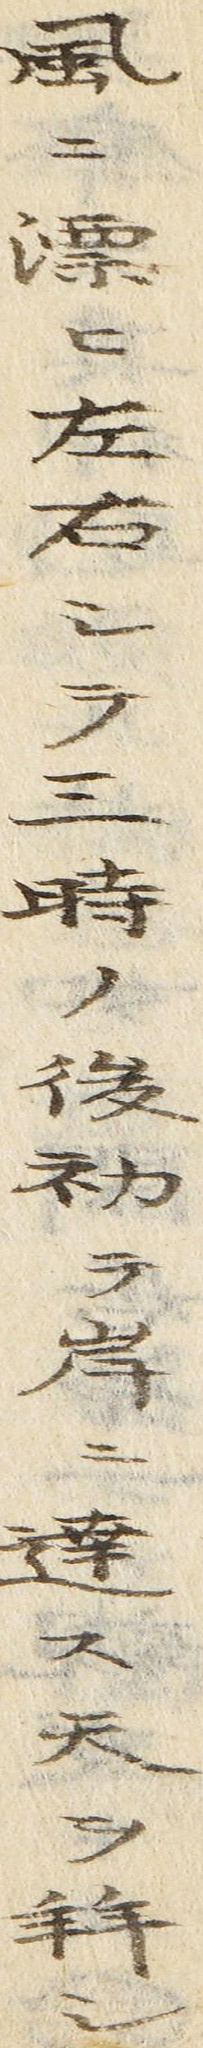風ニ漂ヒ左右シテ三時ノ後初テ岸ニ達ス天ヲ拝シ
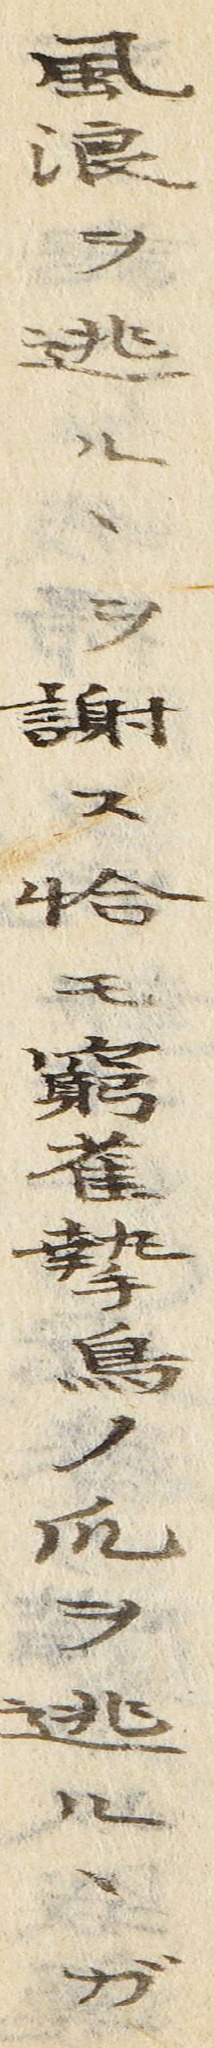風浪ヲ逃ルヽヲ謝ス恰モ窮雀摯鳥ノ爪ヲ逃ルヽガ
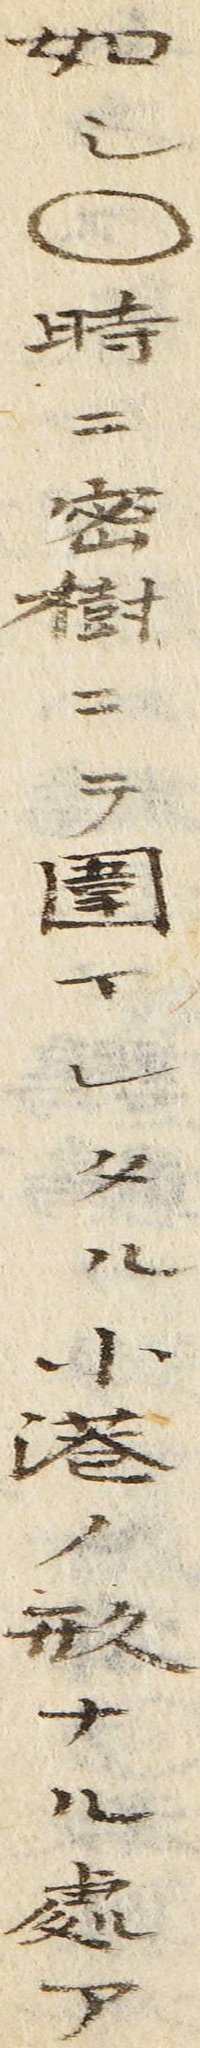如シ◯時ニ密樹ニテ囲イレタル小港ノ形ナル処ア
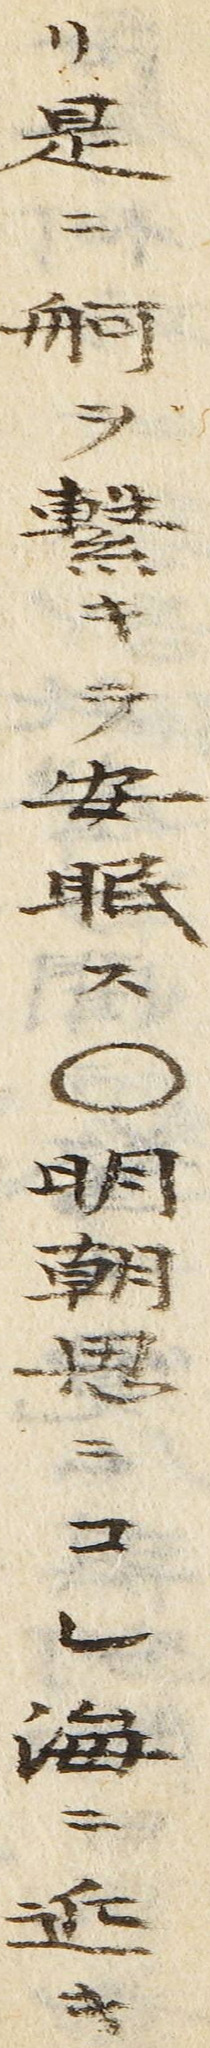リ是ニ舸ヲ繋キテ安眠ス◯明朝思ニコレ海ニ近キ
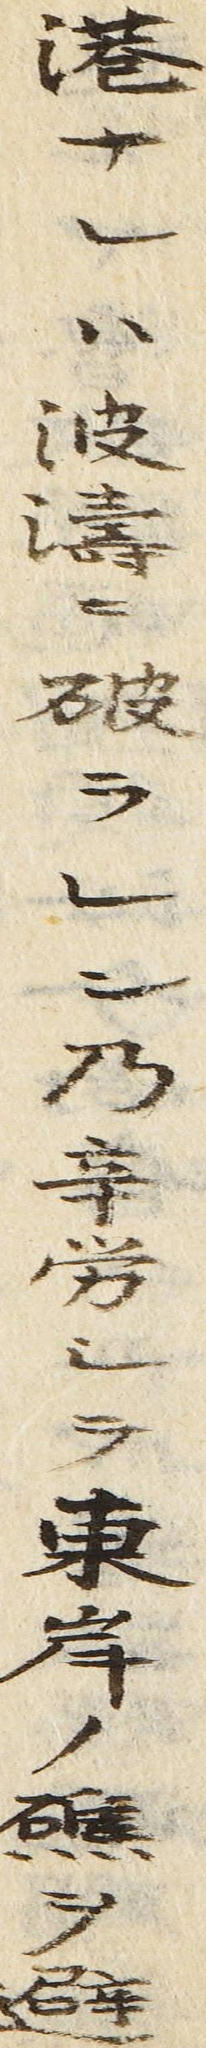港ナレハ波濤ニ破ラレン乃辛労シテ東岸ノ礁ヲ避
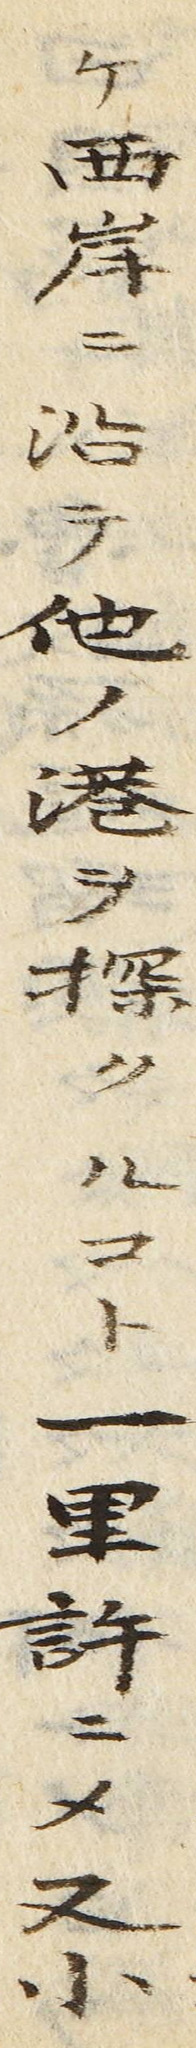ケ西岸ニ沿テ他ノ港ヲ探クルコト一里許ニシテ又小
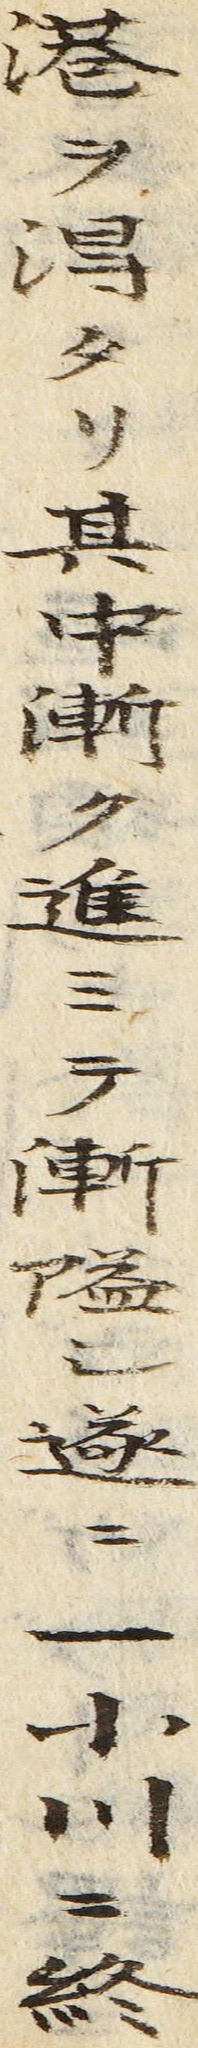港ヲ得タリ其中漸ク進ミテ漸隘シ遂ニ一小川ニ終
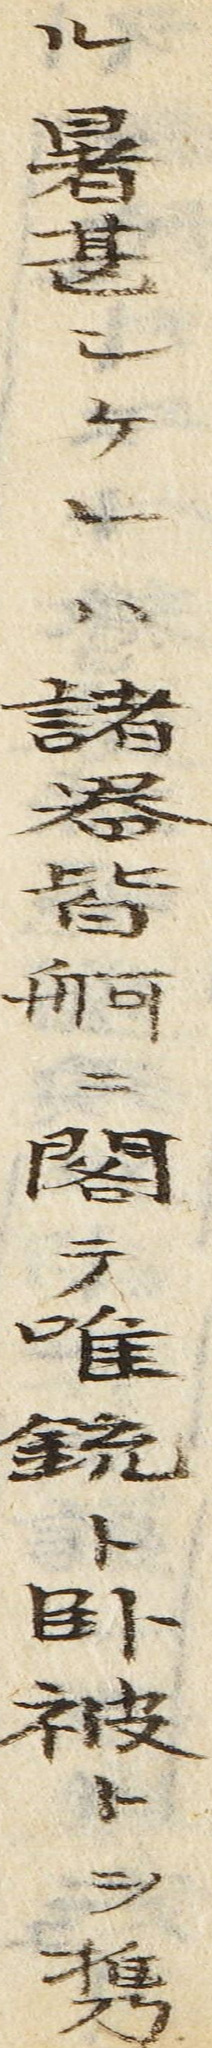ル暑甚シケレハ諸器皆舸ニ閣テ唯銃ト臥被トヲ携
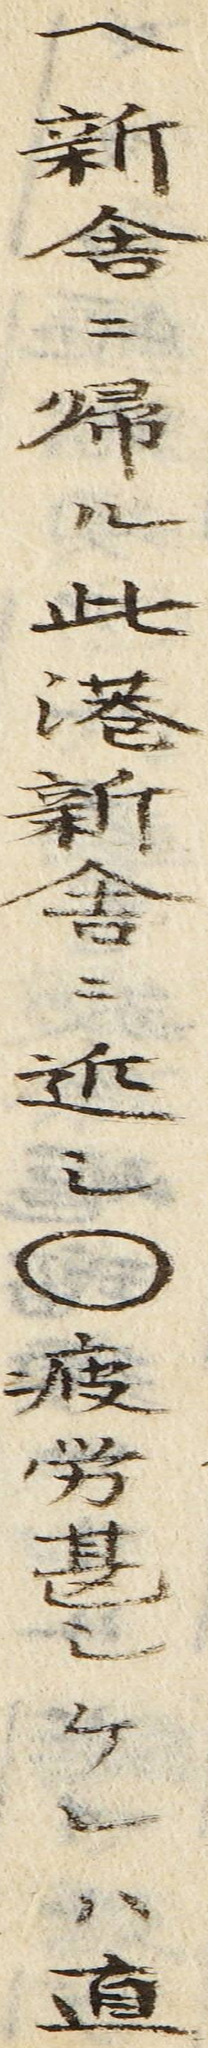ヘ新舎ニ帰ル此港新舎ニ近シ◯疲労甚シケレハ直
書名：漂流紀事
